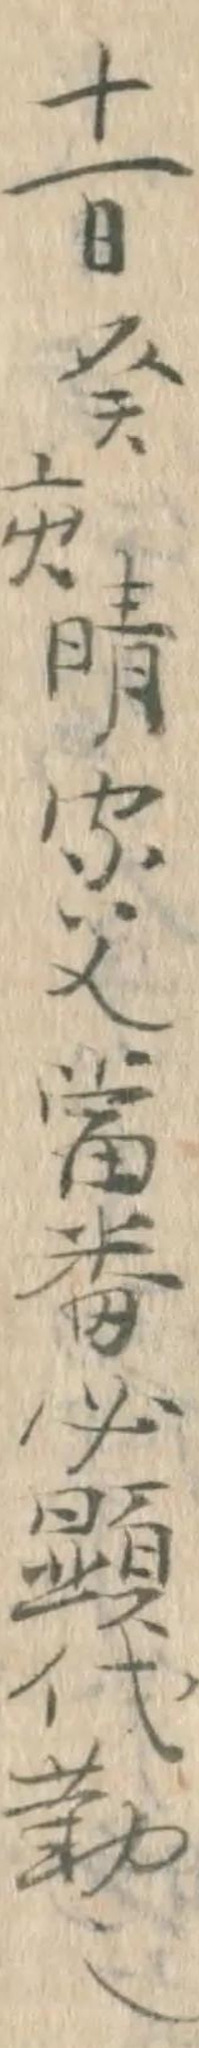十一日癸亥晴家父當番必顕代勤也
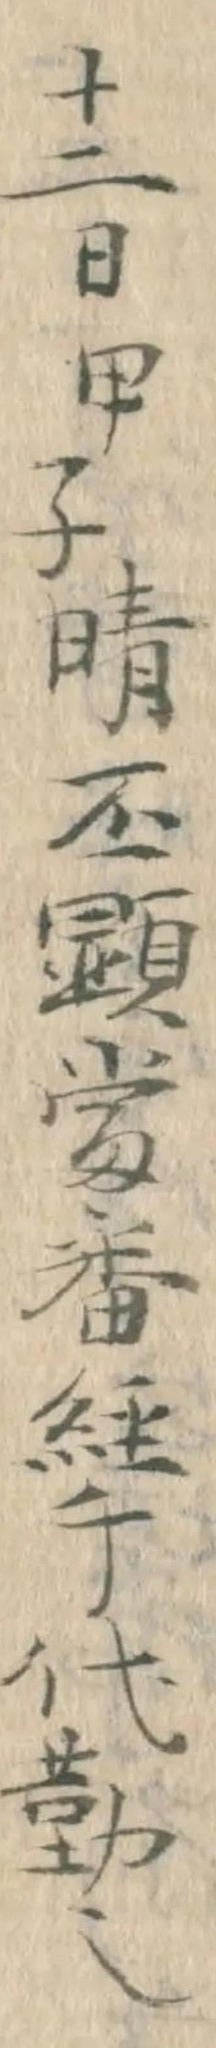十二日甲子晴丕顕當番経千代勤也
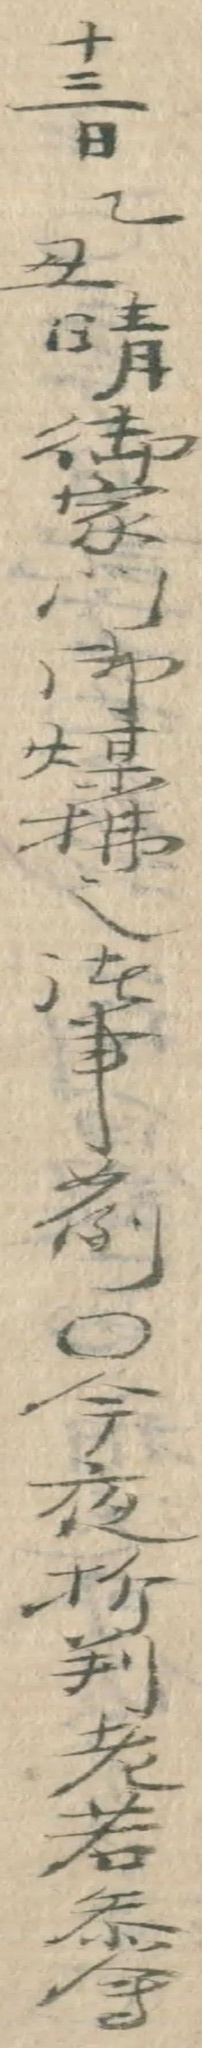十三日乙丑晴御家門御煤払也諸事如例〇今夜折判老若参會

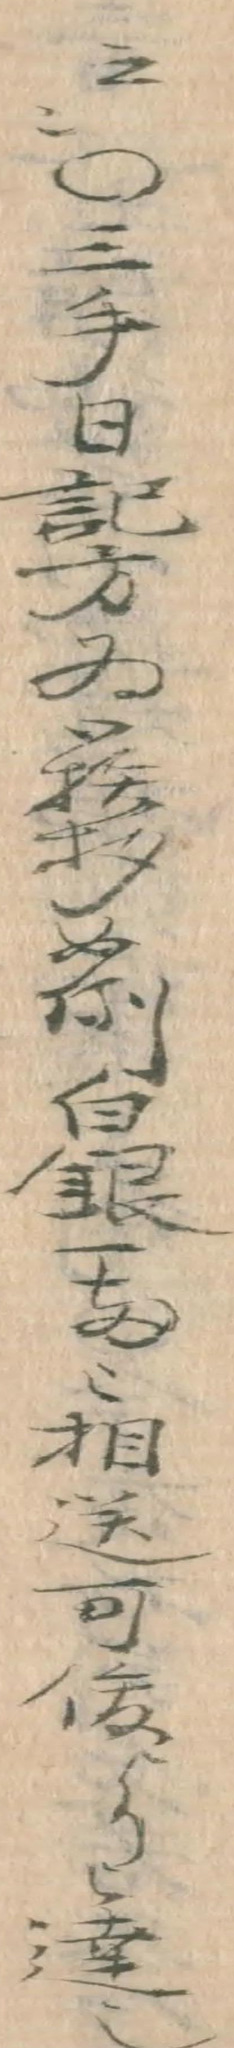云々〇三手日記方為御挨拶如例白銀一両被相送可俊より被達也
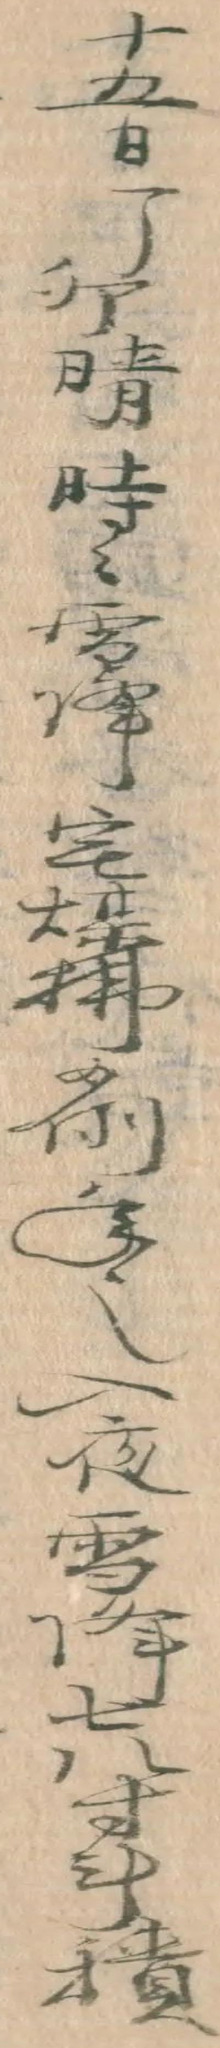十五日丁卯晴時々雪降宅煤払如例年也入夜雪降七八寸斗積
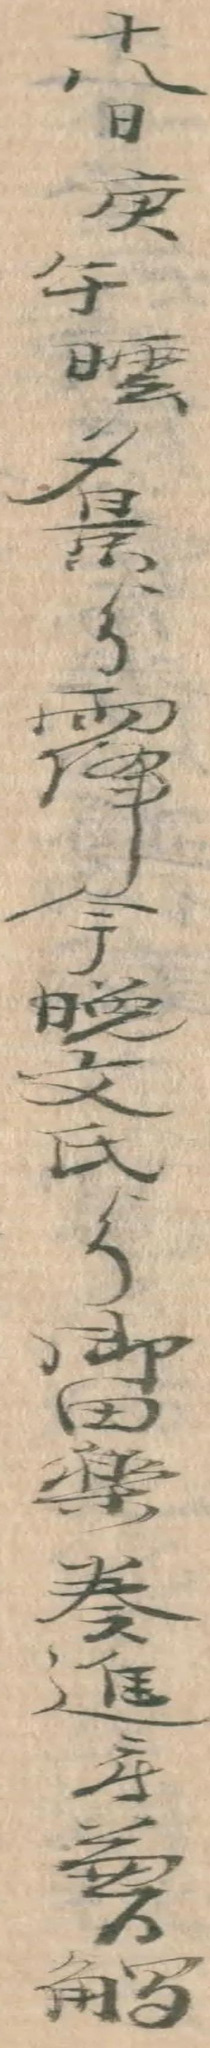十八日庚午曇夕景より雨降今晩文氏より御田楽奏進ニ付兼而触
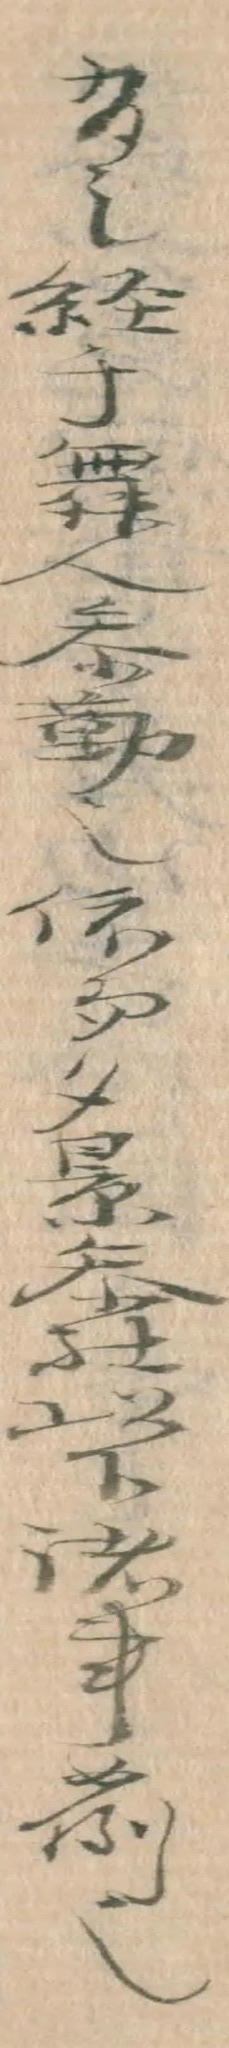有之経千舞人参勤之依而夕景参社以下諸事如例也
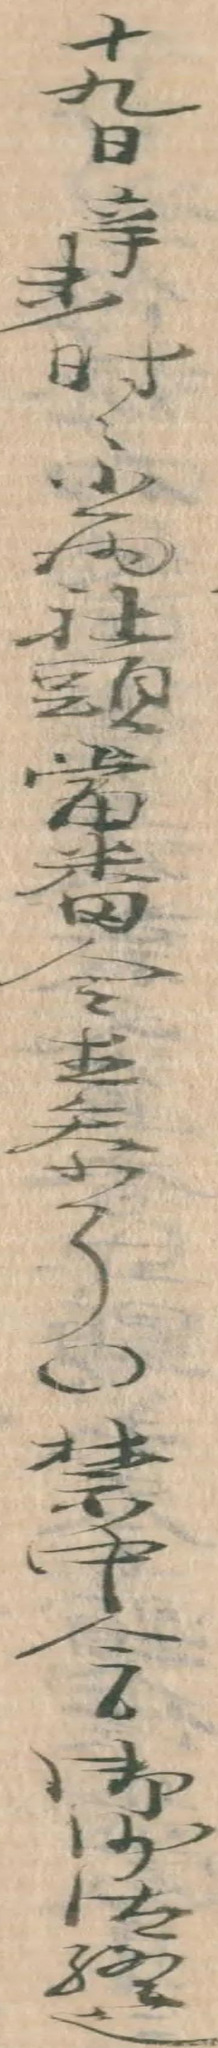十九日辛亥時々小雨社頭當番令直参了〇禁中今日御沙汰終也
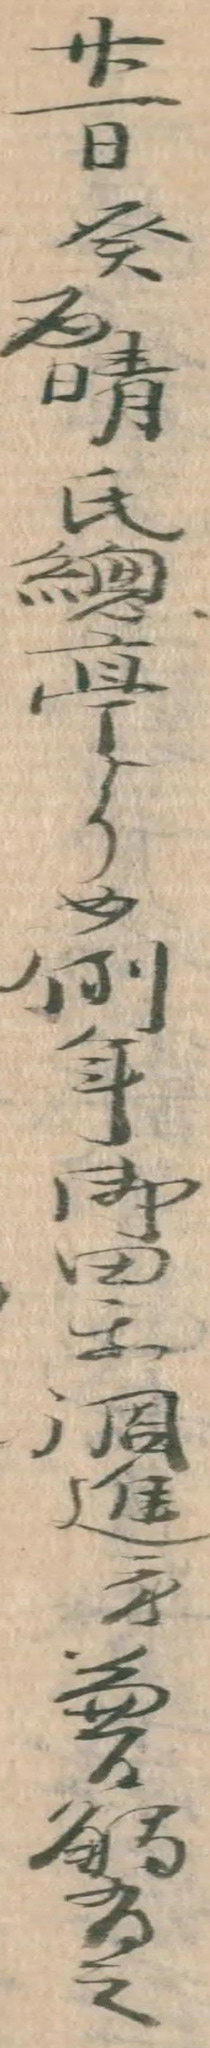廿一日癸酉晴氏總亭より如例年御田楽調進方兼日触有之
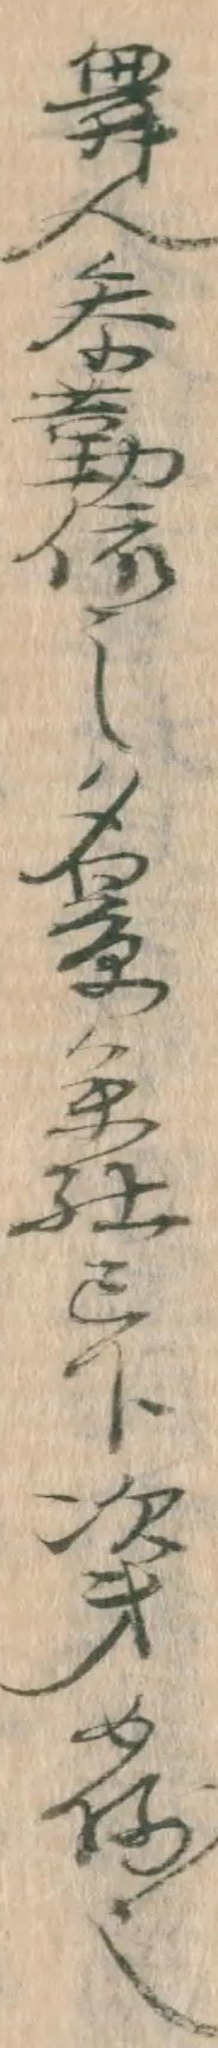舞人参勤依之夕景参社已下次第如例也
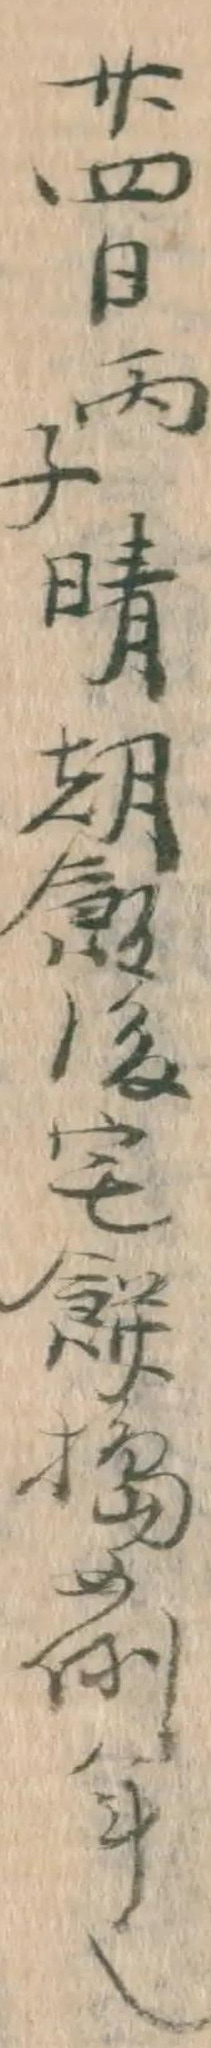廿四日丙子朝飯後宅餅搗如例年也
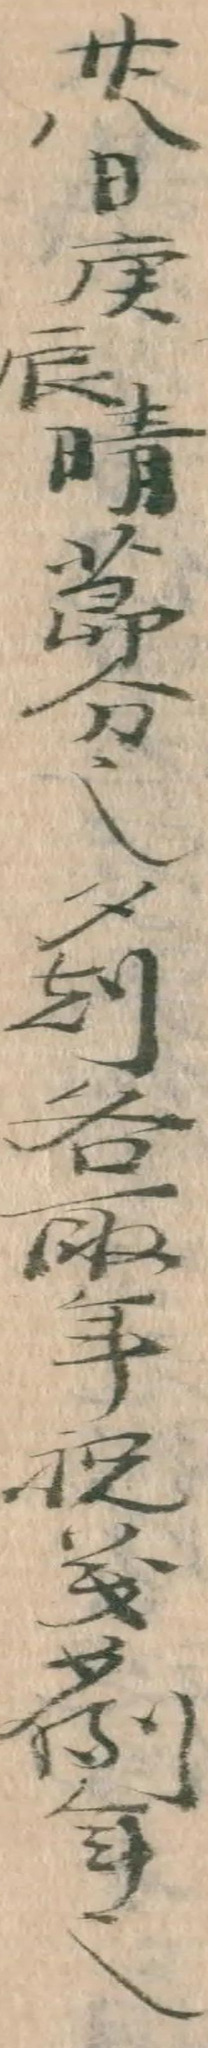廿八日庚亥晴節分也亥刻各取年祝義如年也
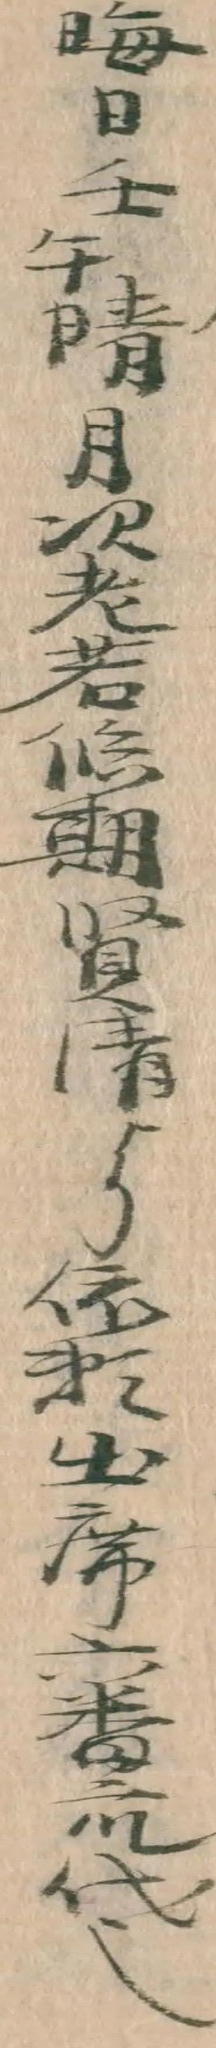晦日壬午晴月次老若臨期賢清より依頼出席六番衆代也
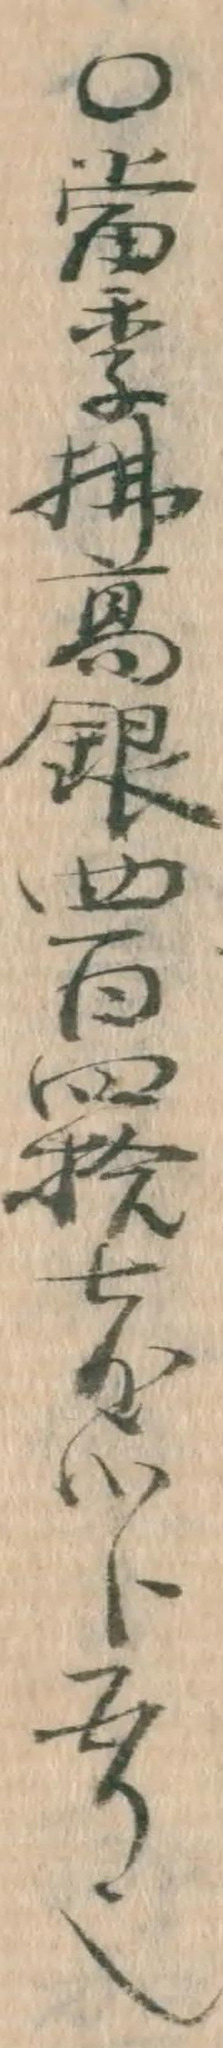○當季払高銀四百四拾七匁弐分五り也

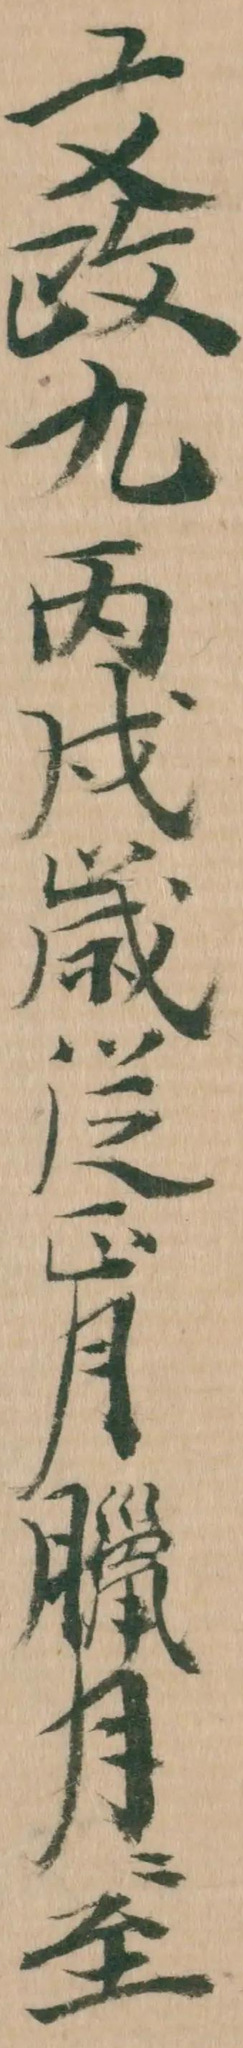文政九丙戌歳従正月臘月ニ至
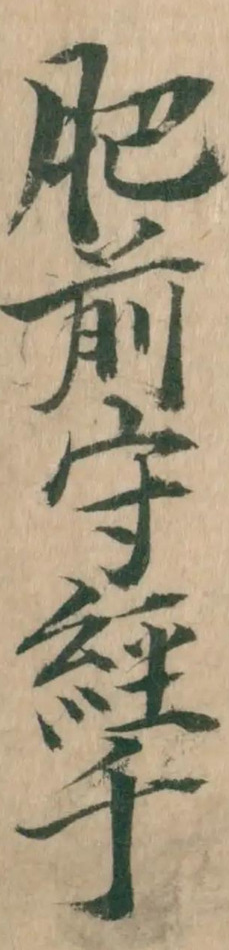肥前守経千
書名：賀茂社記録. 第65冊
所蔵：国立国会図書館 National Diet Library, JAPAN
